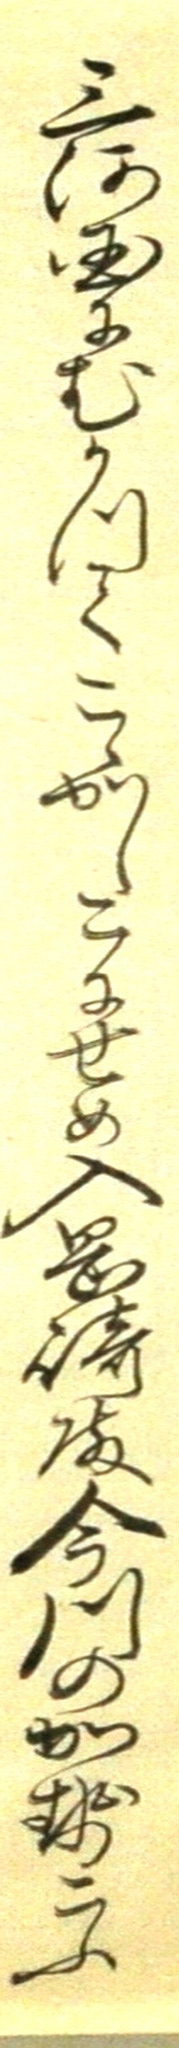三河国にむかつてこゝかしこにせめ入岡崎殿今川の加勢こふ
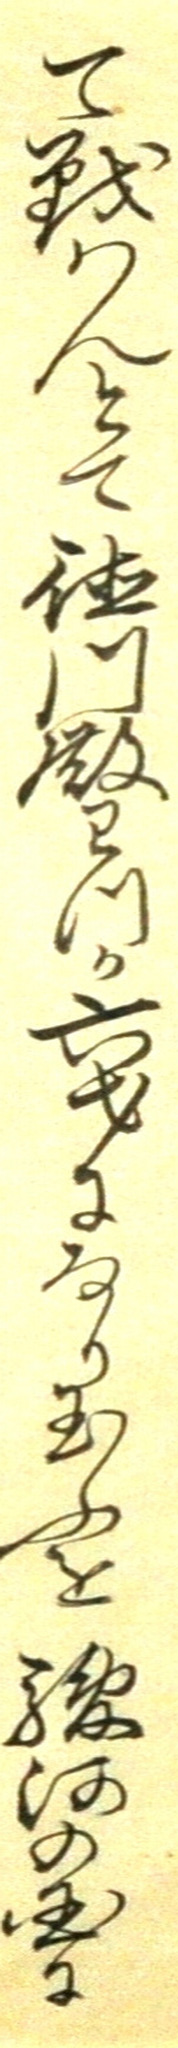て戦はんとて徳川殿わつか六才になり玉ふを駿河の国に
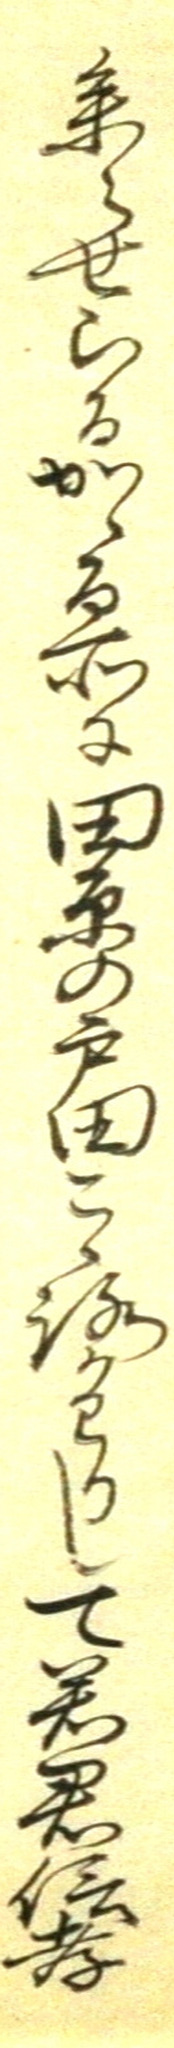参らせらるかゝる所に田原の戸田こゝろかわりして若君信孝
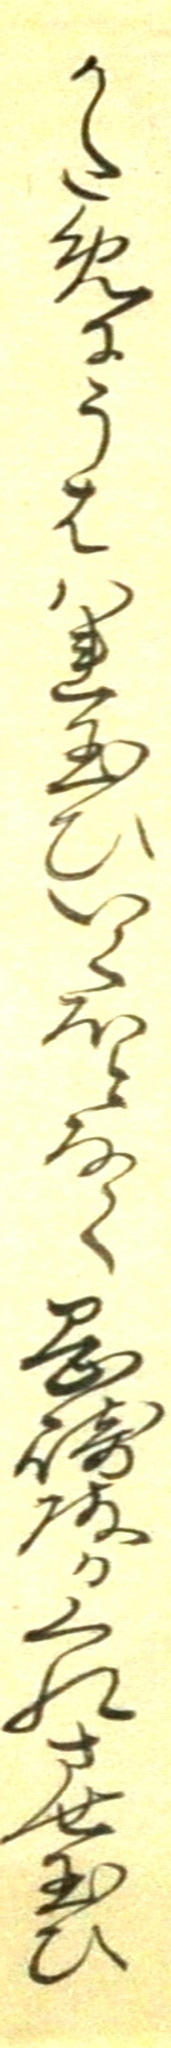かためにうははれ玉ひいくほとなく岡崎殿かくれさせ玉ひ
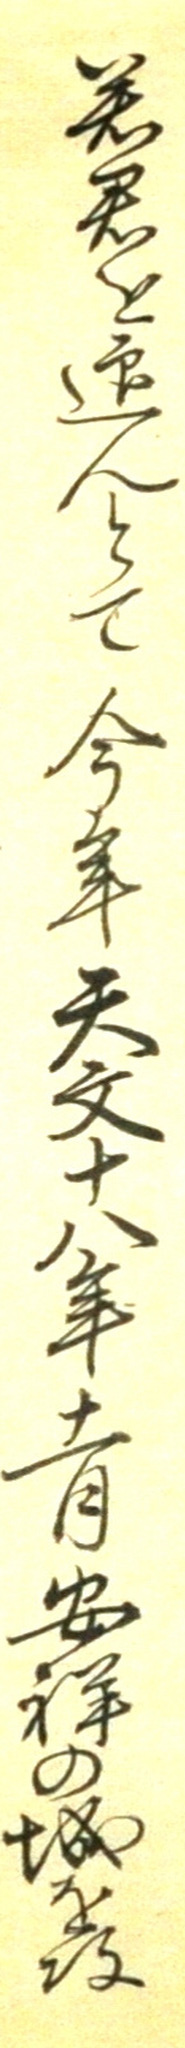若君を迎んとて今年天文十八年十一月安祥の城を攻
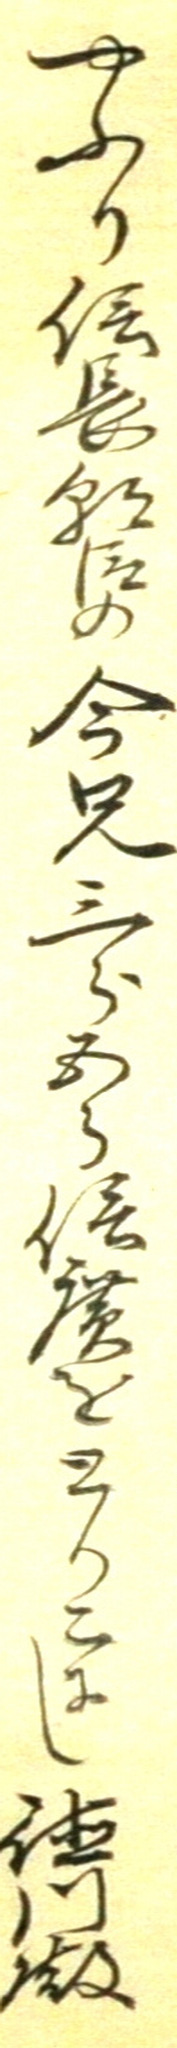やふり信長朝臣の今兄三郎五郎信廣をとりこにし徳川殿
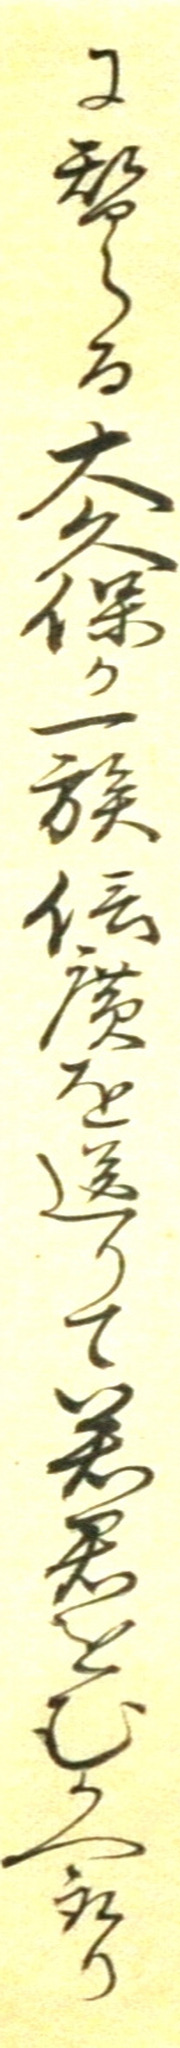に替らる大久保か一族信廣をおくりて若君をむかへ取り
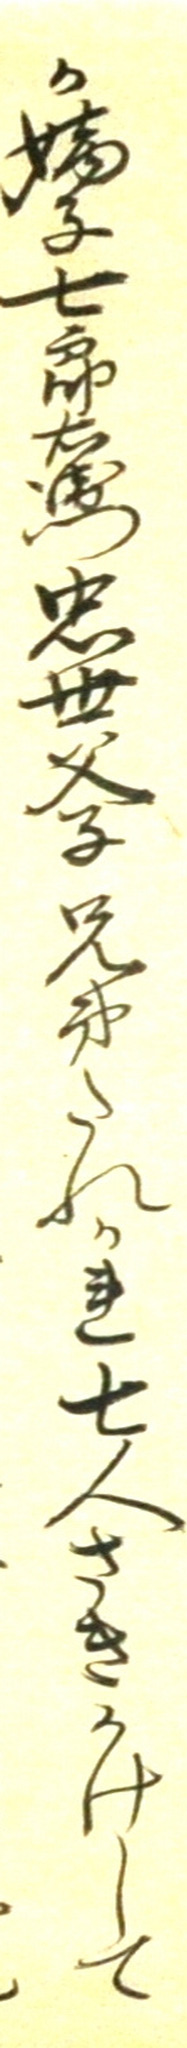か嫡子七郎右衛門忠世父子兄弟たれかれ七人さきかけして
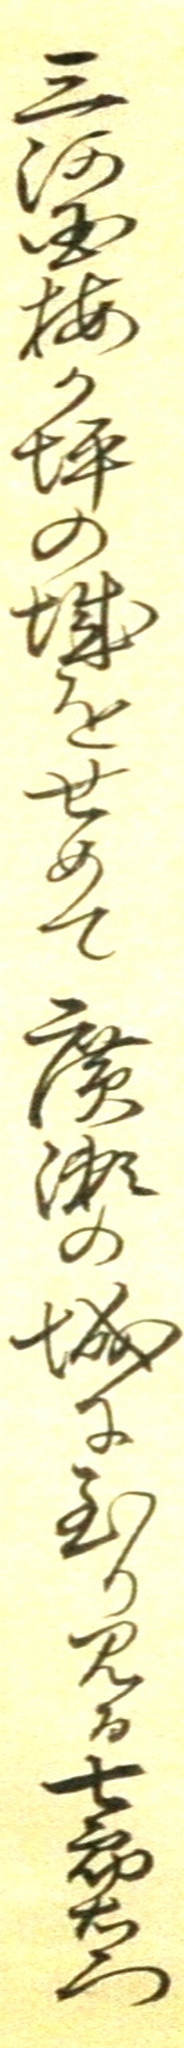三河国梅か坪の城をせめて廣瀬の城に至り見る七郎右衛門
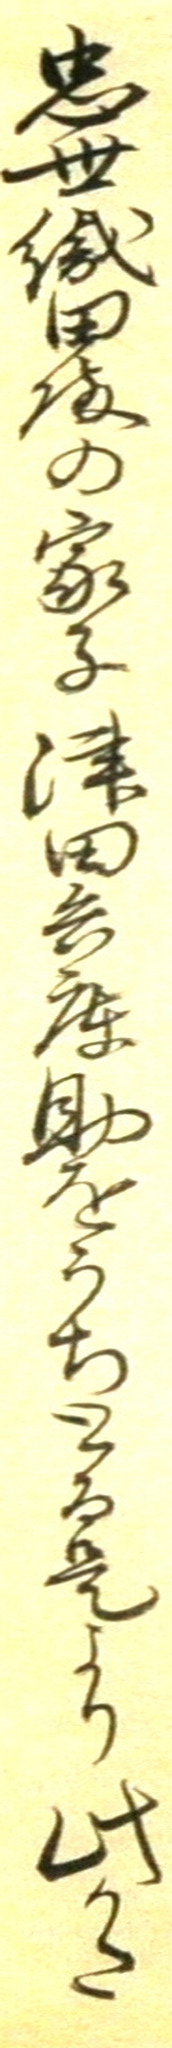忠世織田殿の家子津田兵庫助をうちとる是より此かた
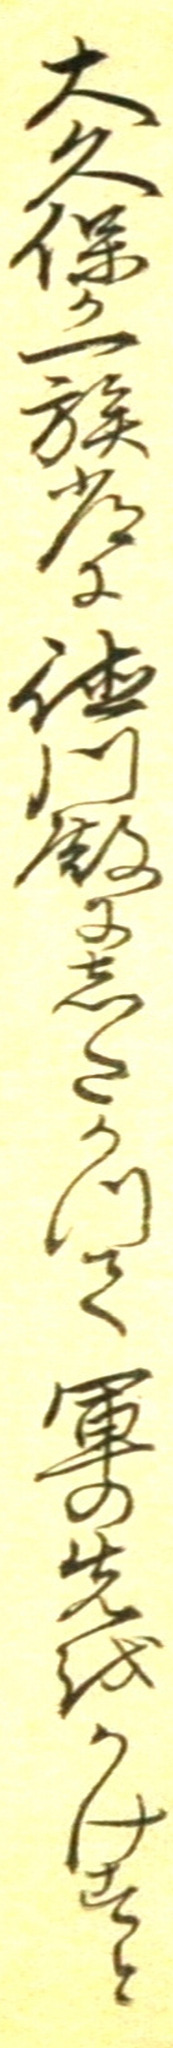大久保一族常に徳川殿にしたかつて軍の先をかけすと
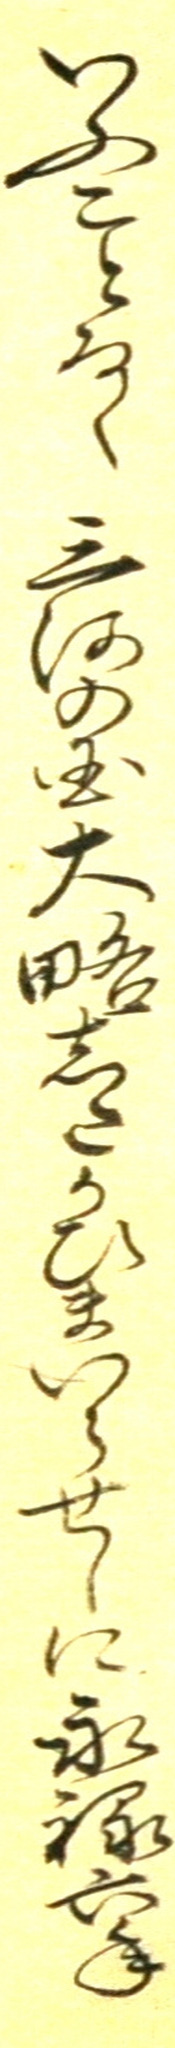いふことなく三河の国大略したかひまいらせしに永禄六年

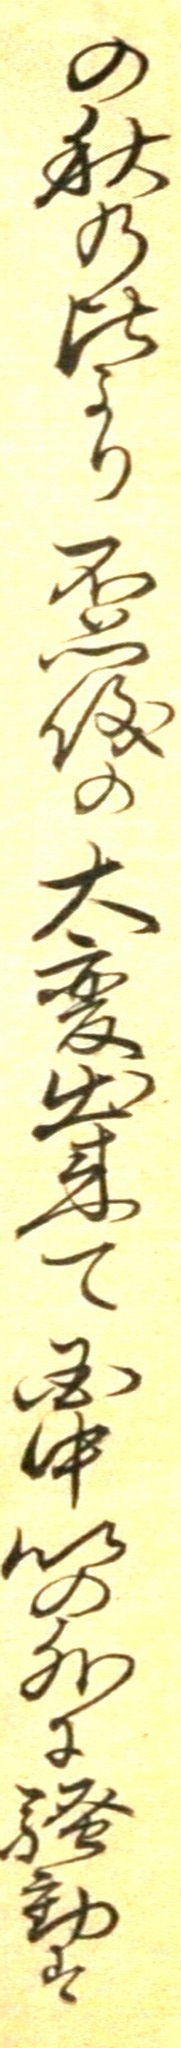の秋の比より不思議の大変出来て国中以の外に騒動す
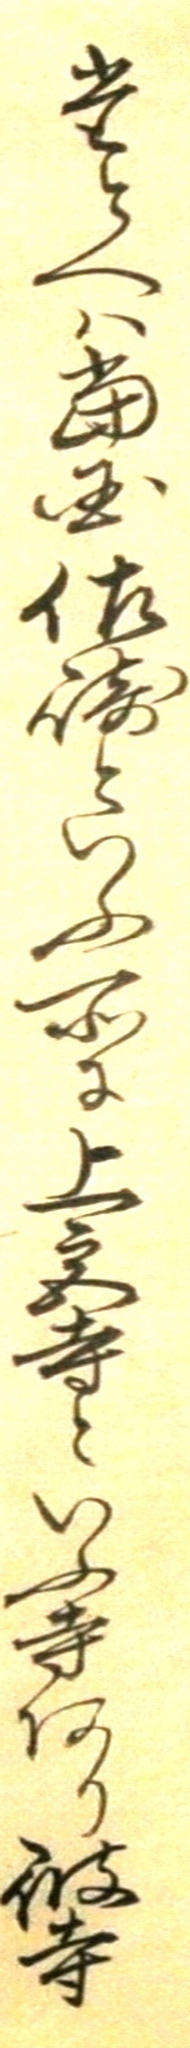たとへは当国佐崎といふ所に上宮寺といふ寺あり彼寺
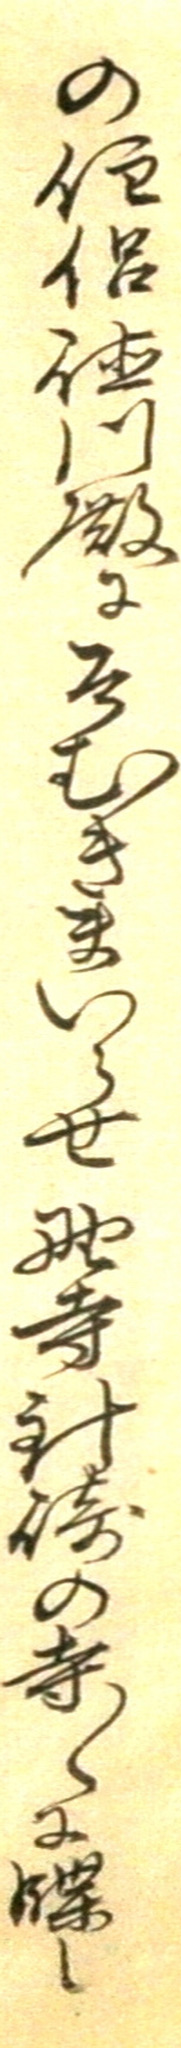の住侶徳川殿にそむきまいらせ野寺針崎の寺々に牒し
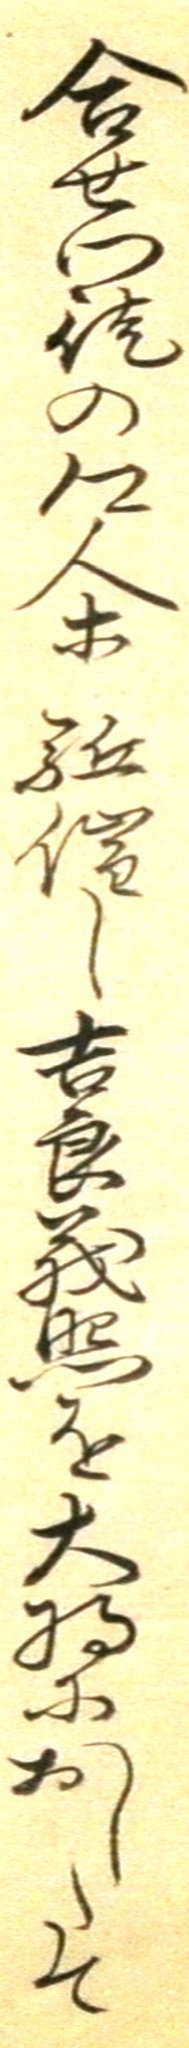合せ門徒の郷人等駈催し吉良義照を大将におしたて
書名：藩翰譜（四・中）
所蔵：伊那市立高遠町図書館・合同会社AMANE
